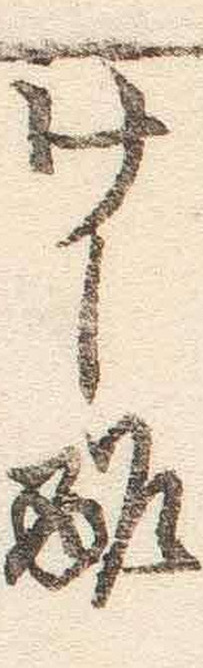けし酢
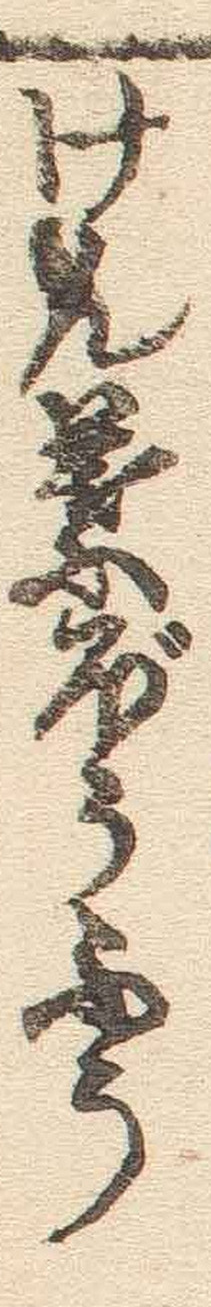けん葉ぼうふう同

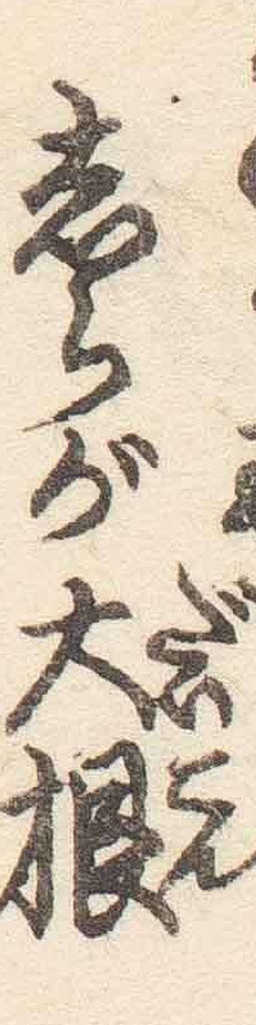しらがうど
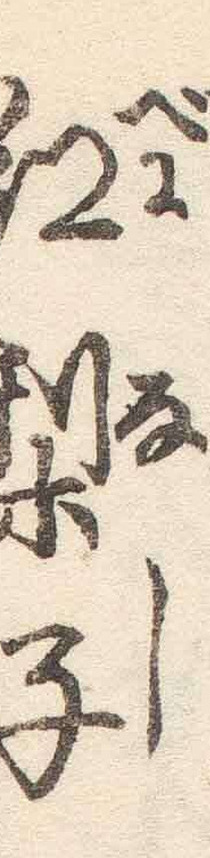紅梨子
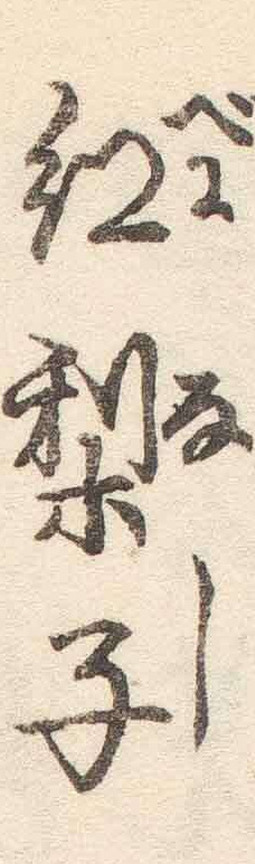紅梨子
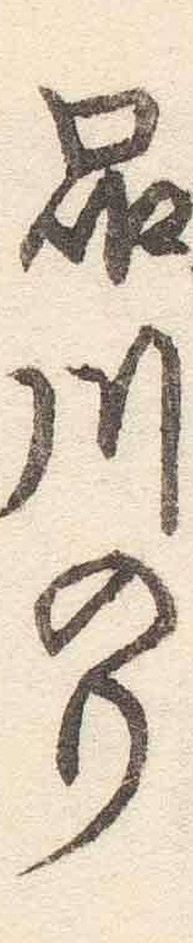品川のり
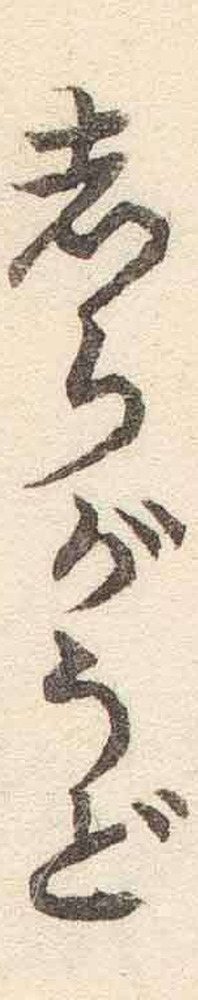しらがうど
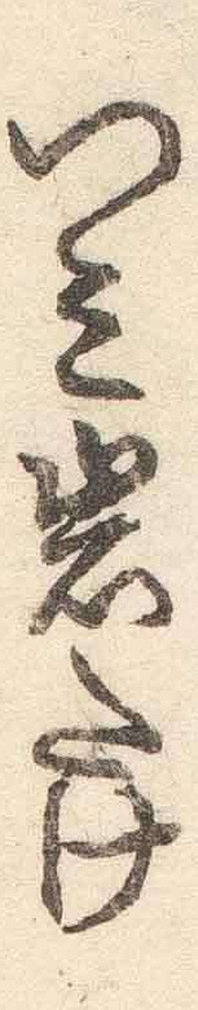つみ岩たけ
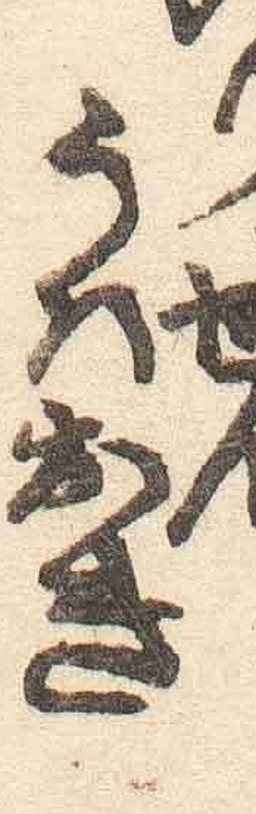うはおき
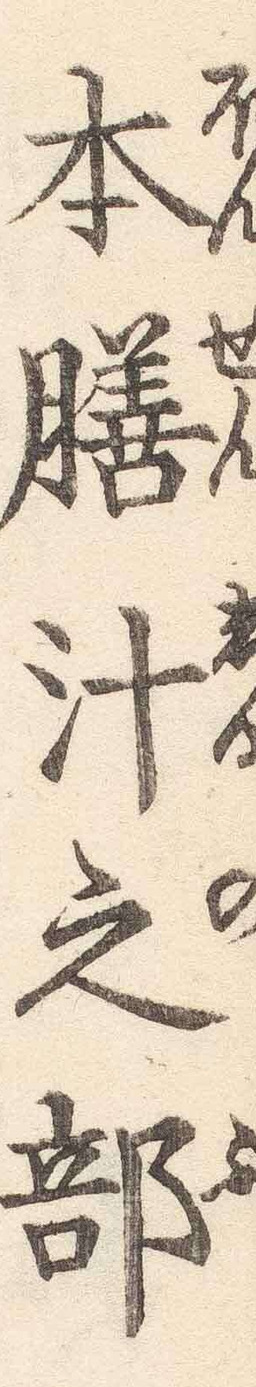本膳汁之部
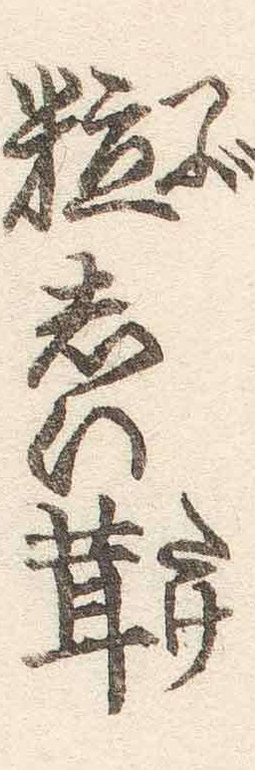粒しい茸
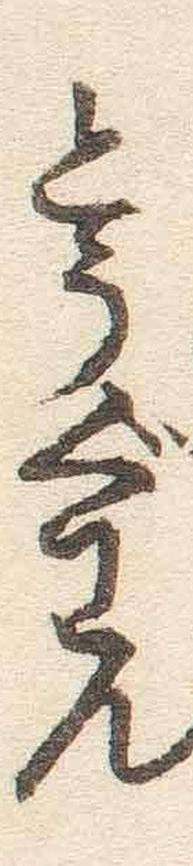とうぐわん

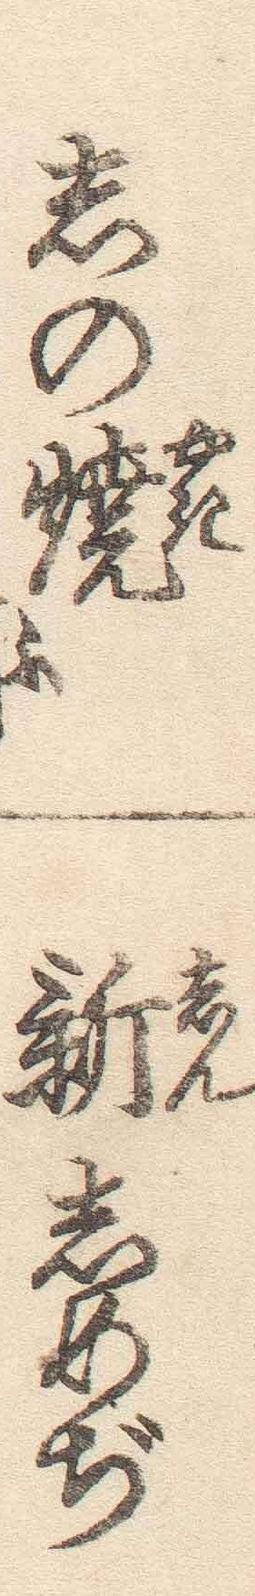しの焼新しめぢ
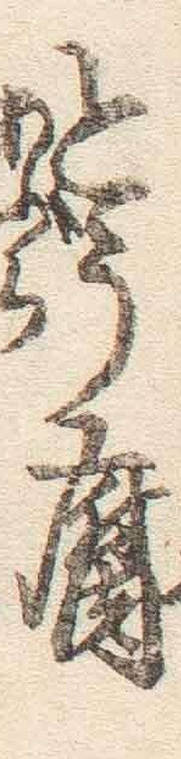とう腐
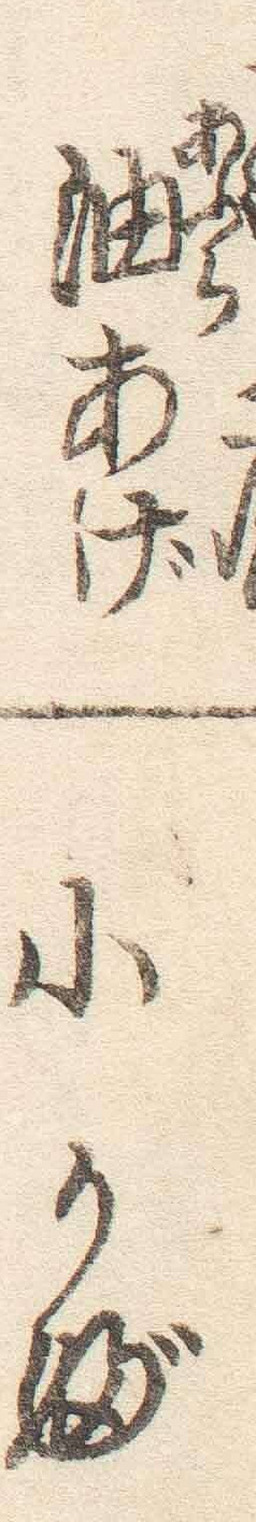油あげ小かぶ
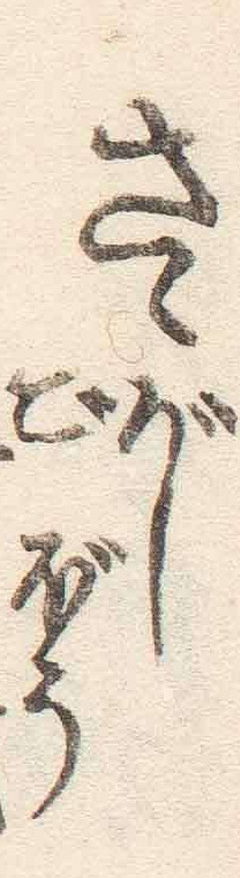さゝがし皮
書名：料理通
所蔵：東京学芸大学附属図書館 国文学研究資料館
